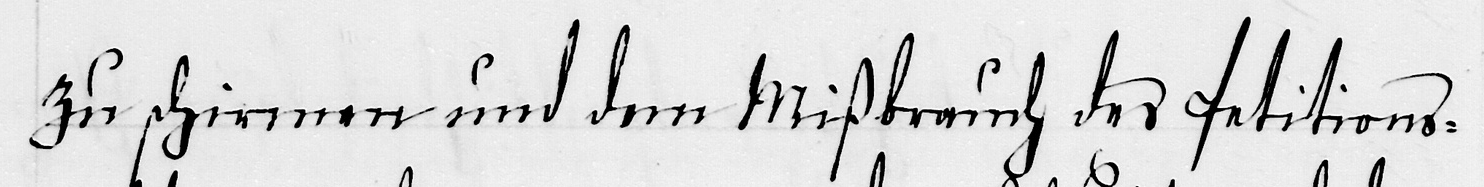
zu schirmen und dem Mißbrauch des Petitions¬
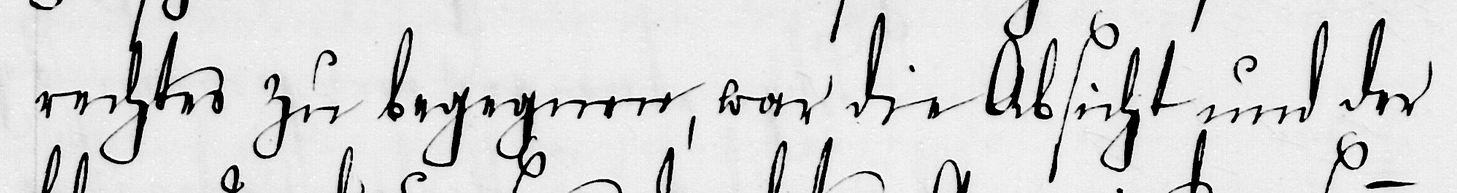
rechtes zu begegnen, war die Absicht und der
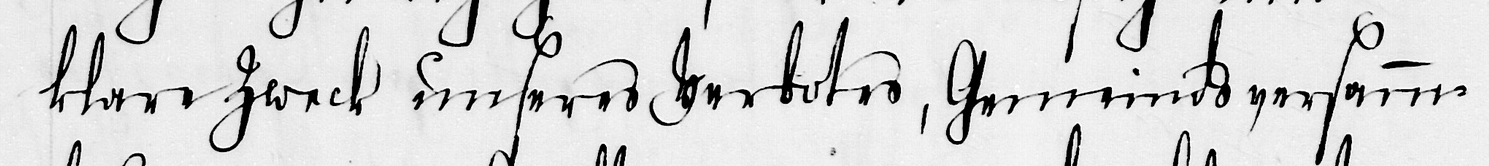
klare Zweck unseres Verbotes, Gemeindsversamm¬
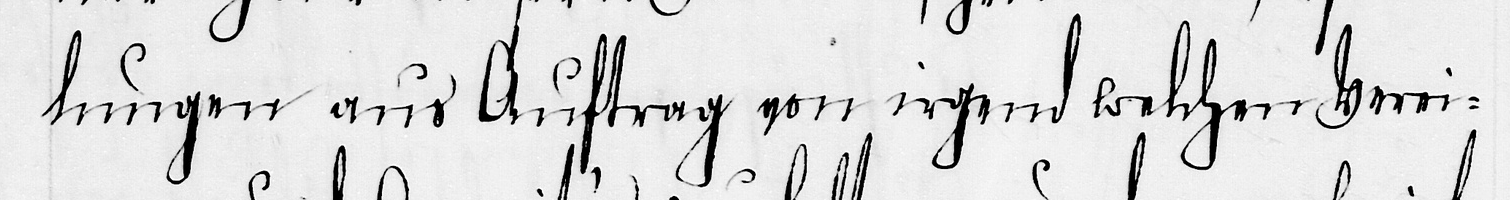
lungen aus Auftrag von irgend welchen Verei¬
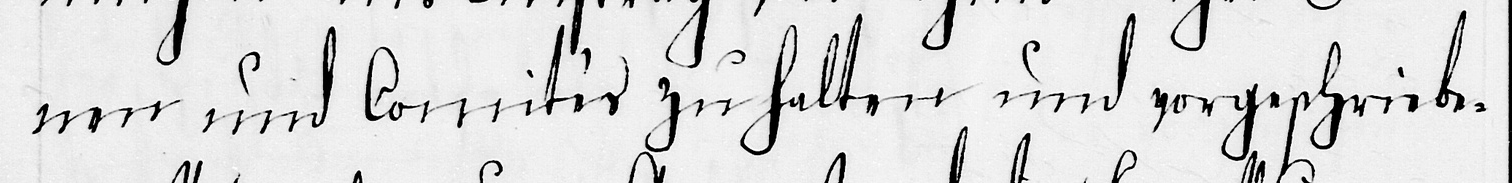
nen und Comités zu halten und vorgeschriebe¬
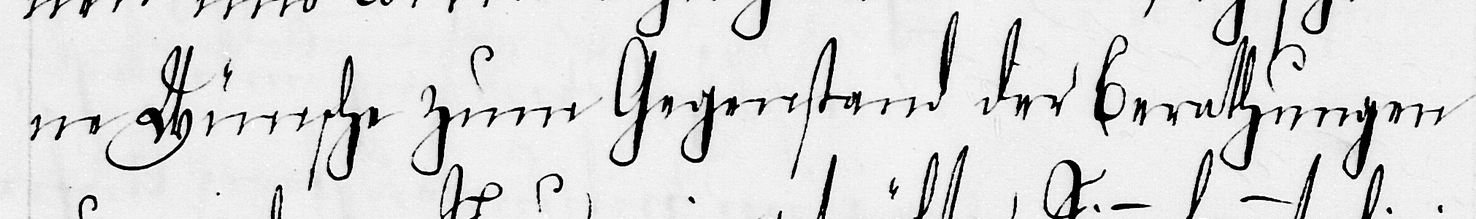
ne Wünsche zum Gegenstand der Berathungen
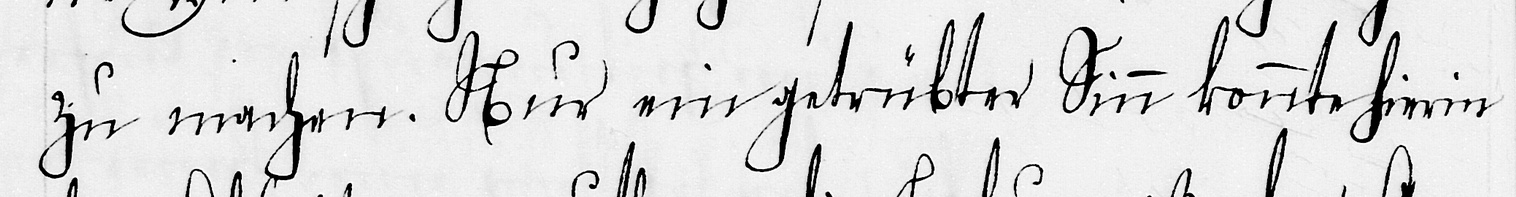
zu machen. Nur ein getrübter Sinn konnte hierin
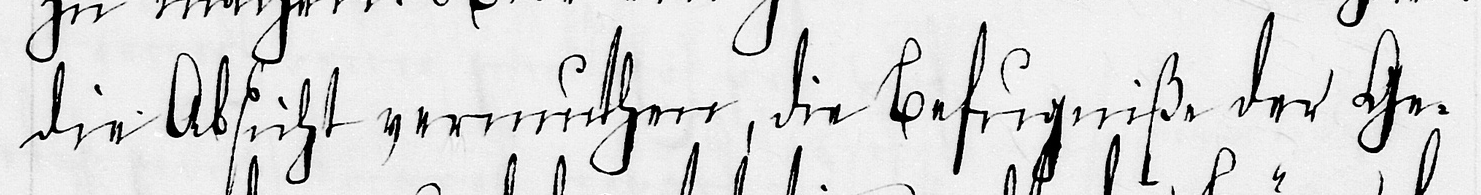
die Absicht vermuthen, die Befugniße oder Ge¬
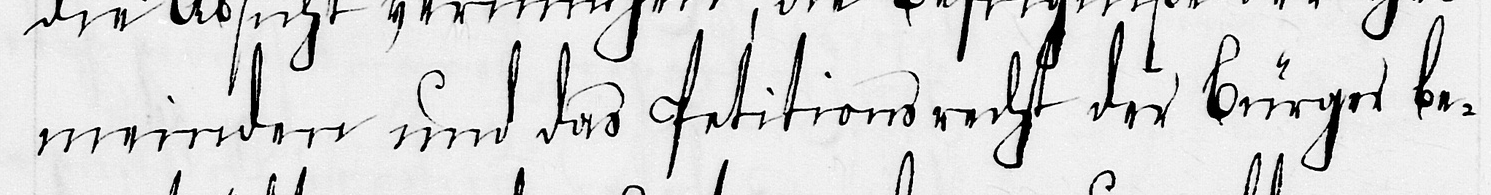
meinden und das Petitionsrecht der Bürger be¬
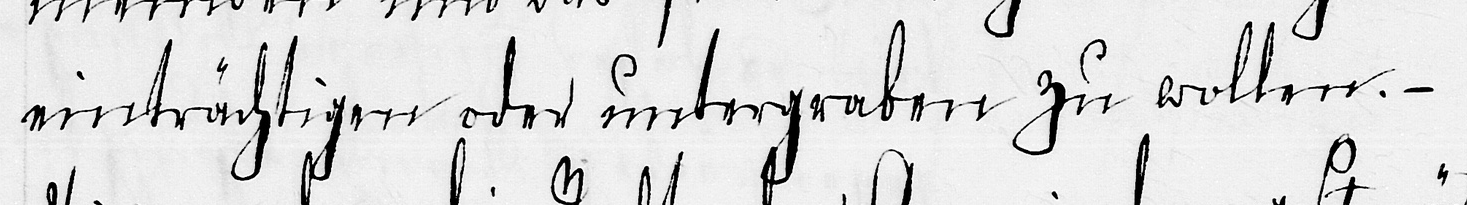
einträchtigen oder untergraben zu wollen.
